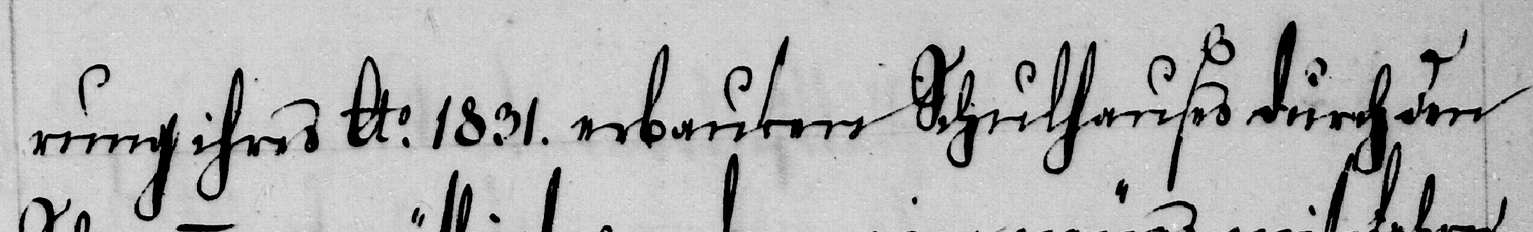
rung ihres Ao. 1831. erbauten Schulhauses durch den
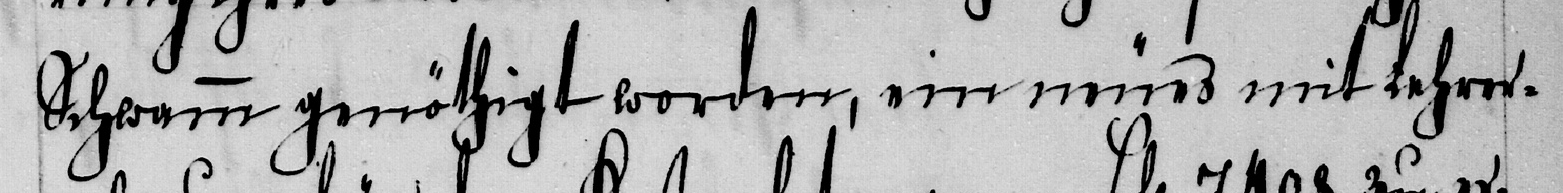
Schwamm genöthigt worden, ein neues mit Lehrer¬
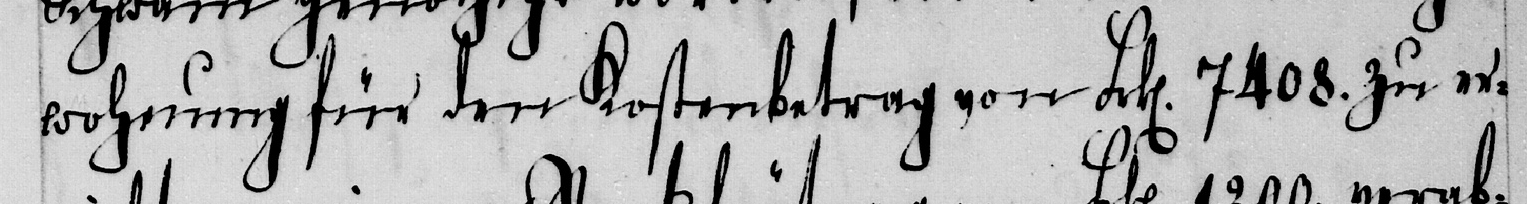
wohnung für den Kostenbetrag von Frk[en] 7408. zu er¬
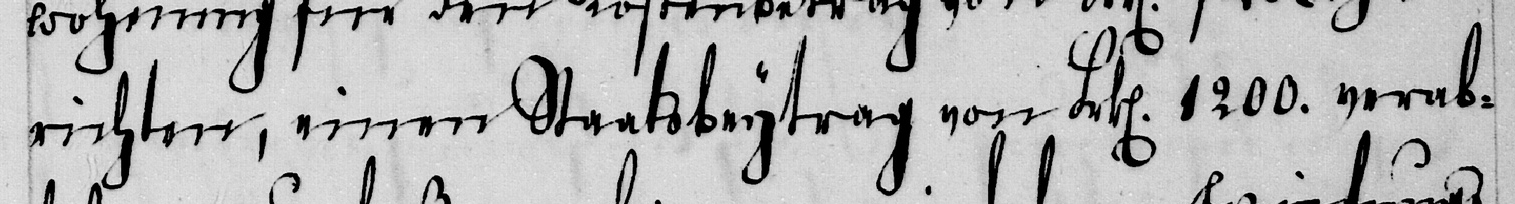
richten, einen Staatsbeitrag von Frk[en]. 1200. verab¬
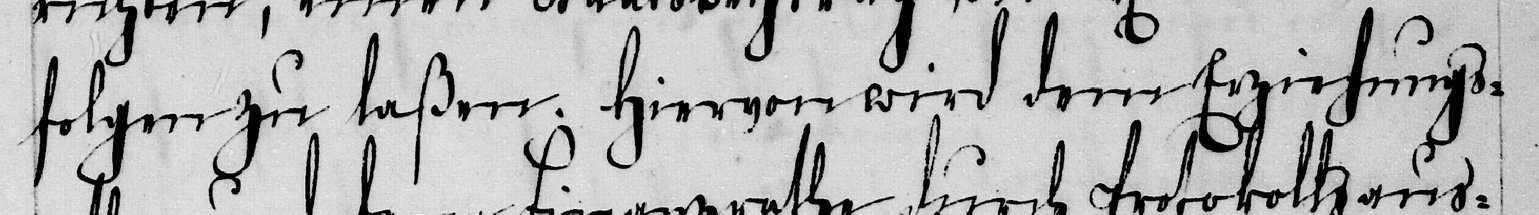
folgen zu laßen. Hiervon wird dem Erziehungs¬
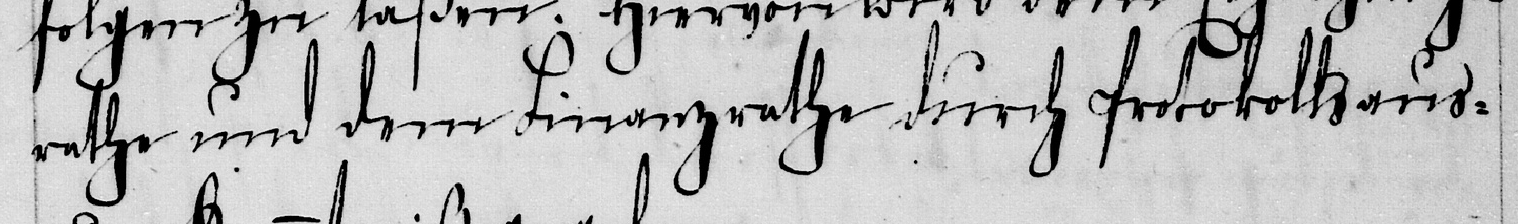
rathe und dem Finanzrathe durch Protokollsaus¬
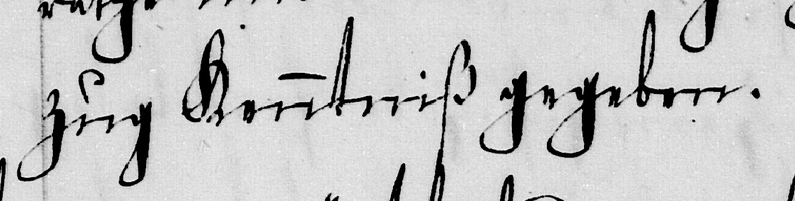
zug Kenntniß gegeben.
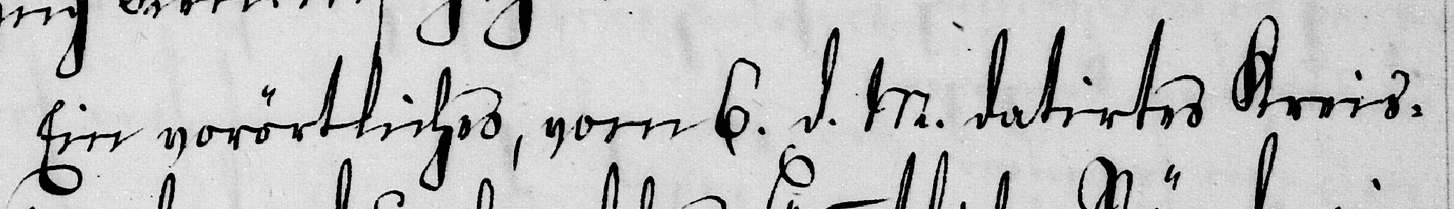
Ein vorörtliches, vom 6. d. M. datirtes Kreis¬
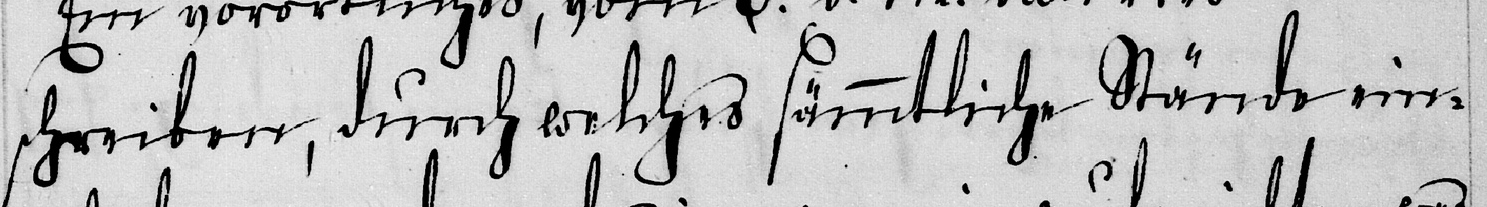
schreiben, durch welches sämmtliche Stände ein¬
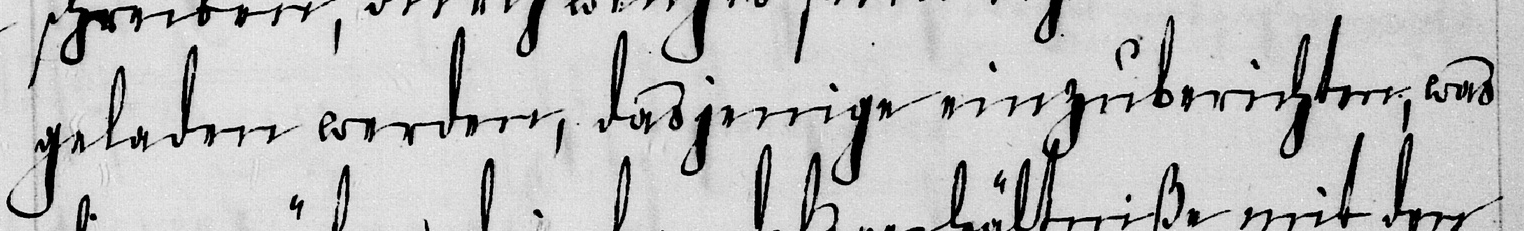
geladen werden, dasjenige einzuberichten, was
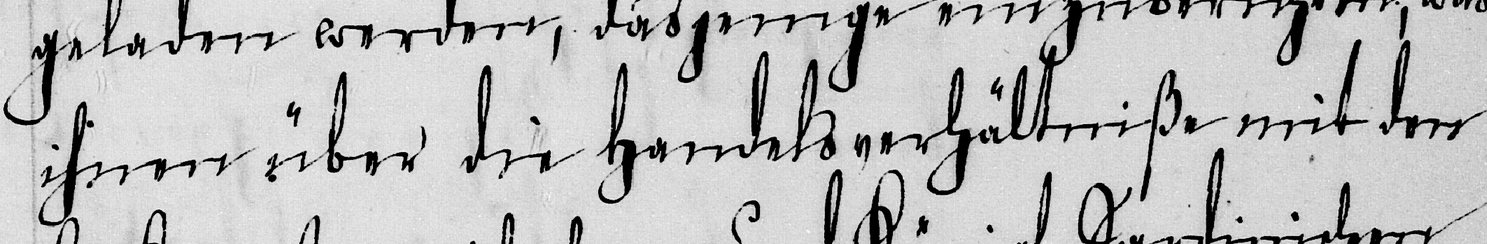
ihnen über die Handelverhältniße mit den
